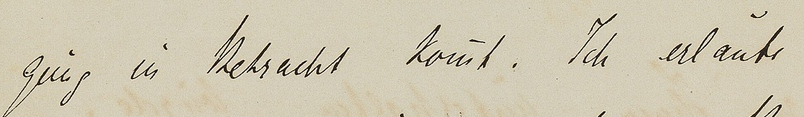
gung in Betracht kommt. Ich erlaube
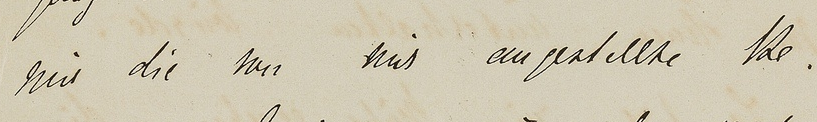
mir die von mir angestellte Be-
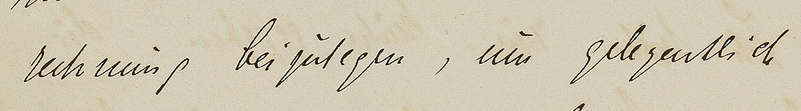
rechnung beizulegen, um gelegentlich
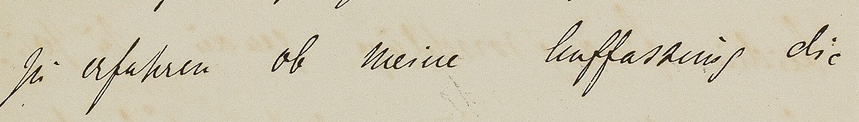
zu erfahren ob meine Auffassung die
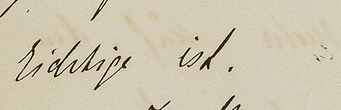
Richtige ist.
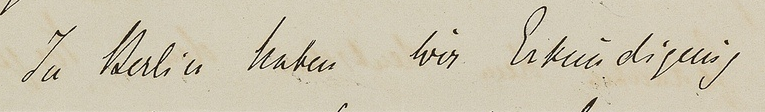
In Berlin haben wir Erkundigung
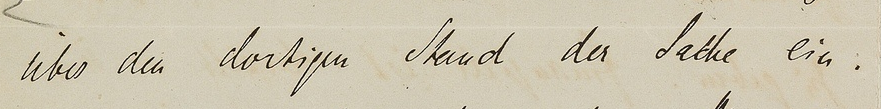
über den dortigen Stand der Sache ein-
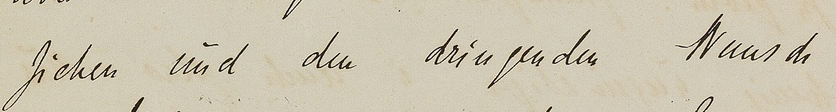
ziehen und den dringenden Wunsch
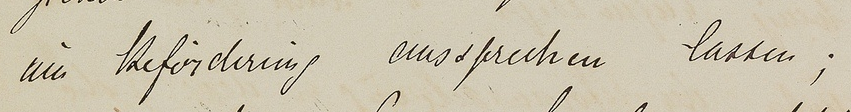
um Beförderung aussprechen lassen;
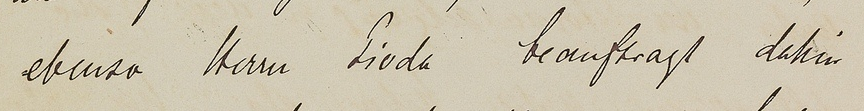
ebenso Herrn Pioda beauftragt dahin
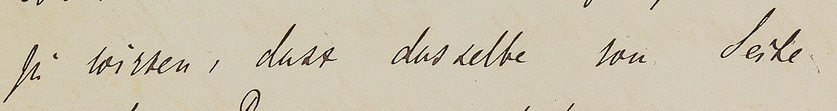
zu wirken, dass dasselbe von Seite
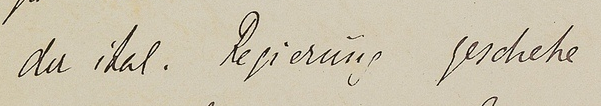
der ital. Regierung geschehe.
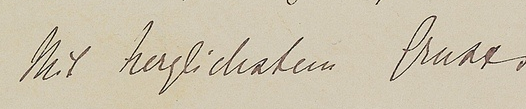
Mit herzlichstem Grusse
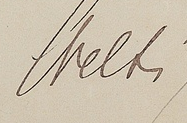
Welti
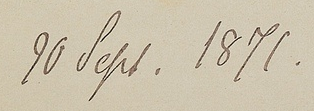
20 Sept. 1871.
